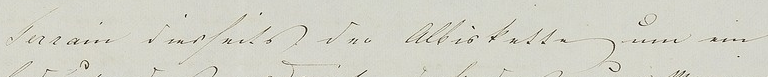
Terrain diesseits der Albiskette um ein
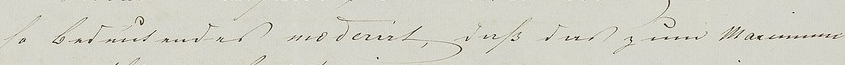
so Bedeutendes moderirt, daß das zum Maximum
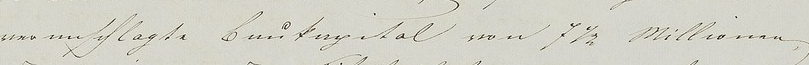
veranschlagte Baukapital von 7½ Millionen,
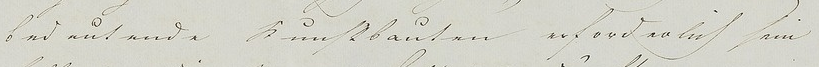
bedeutende Kunstbauten erforderlich sein
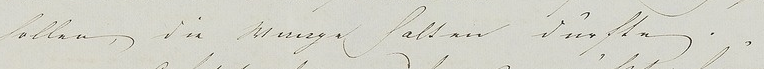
sollen, die Waage halten dürfte.
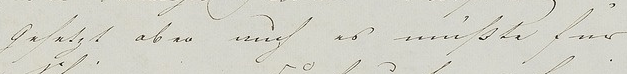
Gesetzt aber auch es müßte für
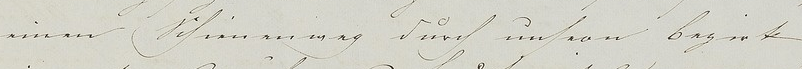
einen Schienenweg durch unsern Bezirk
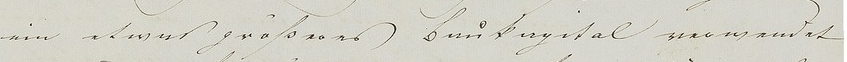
ein etwas größeres Baukapital verwendet
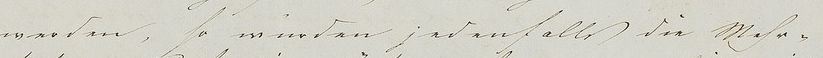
werden, so würden jedenfalls die Mehr-
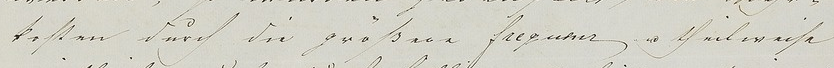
kosten durch die größere Frequenz & theilweise
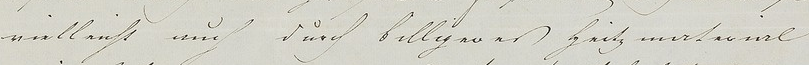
vieleicht auch durch billigeres Heitzmaterial
